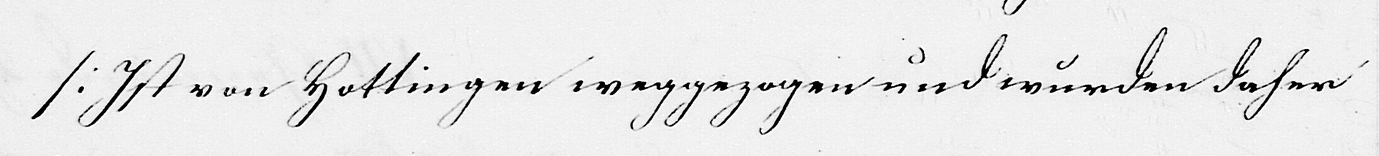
[Ist von Hottingen weggezogen und wurden daher
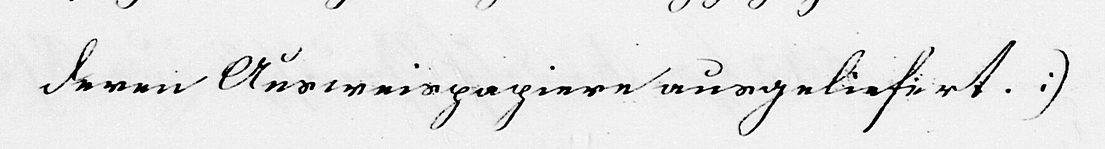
deren Ausweispapiere ausgeliefert.]
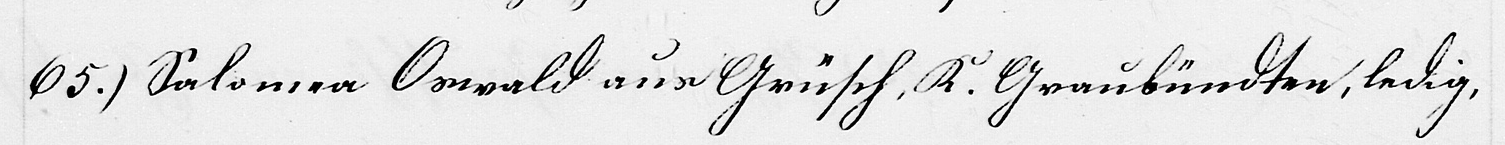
65.) Salomea Oswald aus Grüsch, K. Graubündten, ledig,
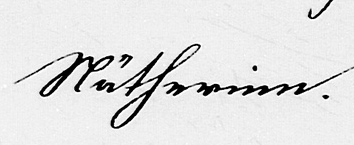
Nätherinn.
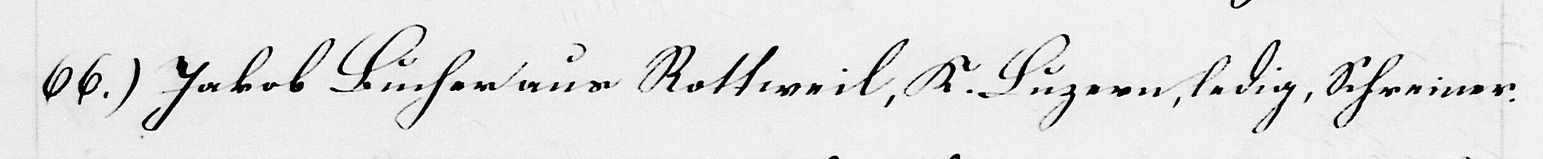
66.) Jakob Bucher aus Rottweil, K. Luzern, ledig, Schreiner.
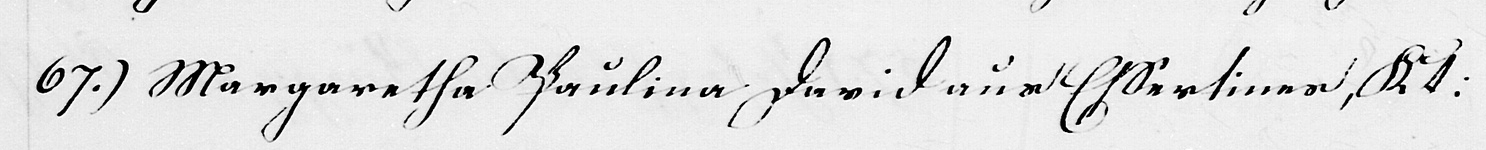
67.) Margaretha Paulina David aus Espertines, Kt:
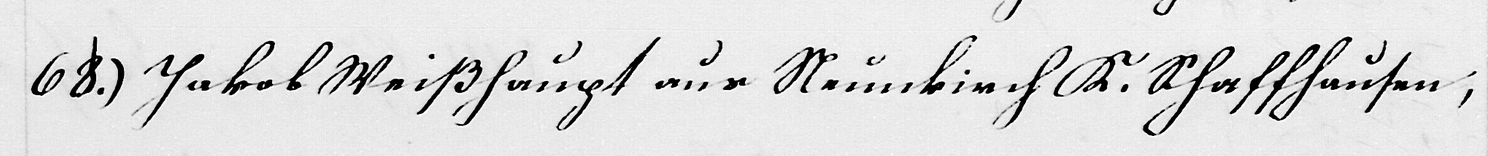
68.) Jakob Weißhaupt aus Neunkirch K. Schaffhausen,
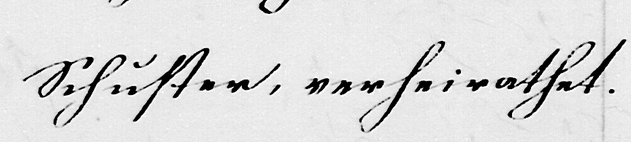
Schuster, verheirathet.
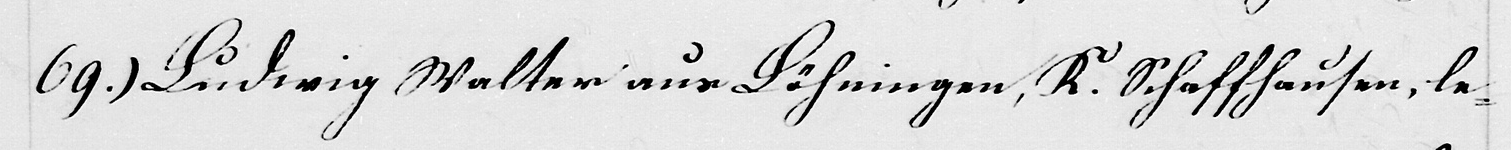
69.) Ludwig Walter aus Löhningen, K. Schaffhausen, le¬
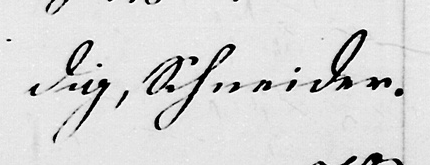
dig, Schneider.
